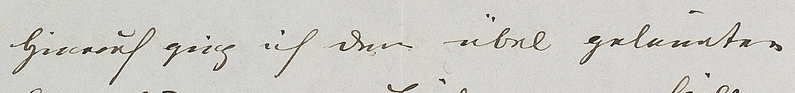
Hierauf ging ich dem übel gelaunten
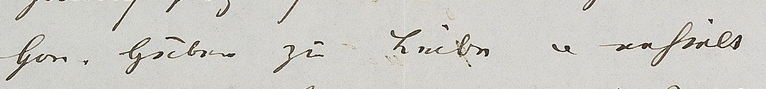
Hrn. Huber zu Leibe & erhielt
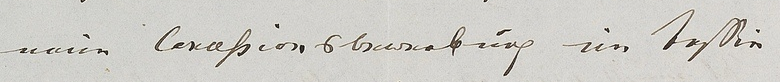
neue Concessionsbewerbung im Tessin
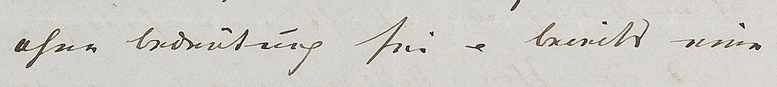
ohne Bedeutung sei & bereits eine
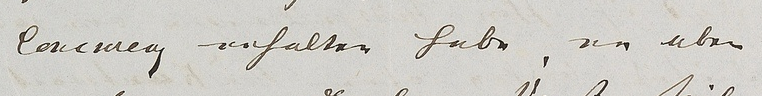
Concurenz erhalten habe, er aber
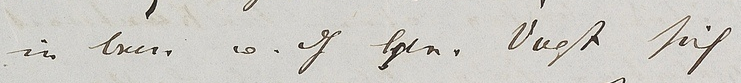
in Bern & dh Hrn. Vogt sich
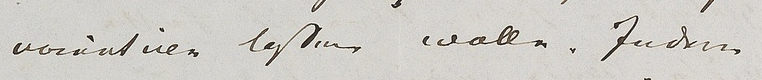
orientiren lassen wolle. Indem
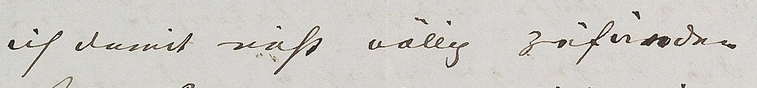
ich damit nicht völlig zufrieden
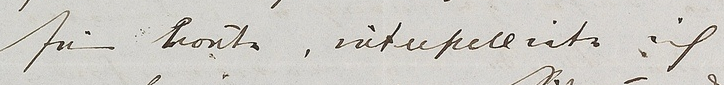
sein konnte, interpellirte ich
